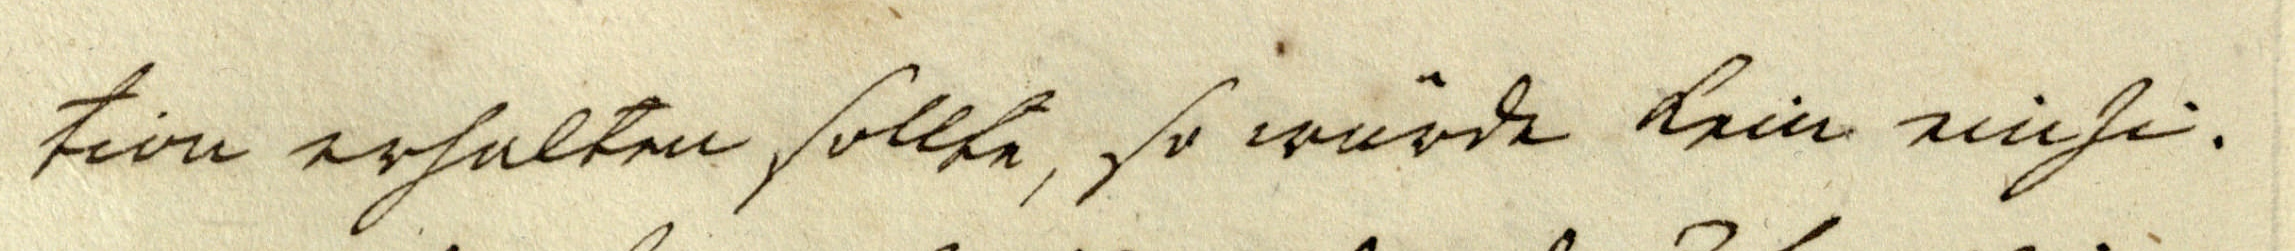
tion erhalten sollte, so würde kein einzi¬
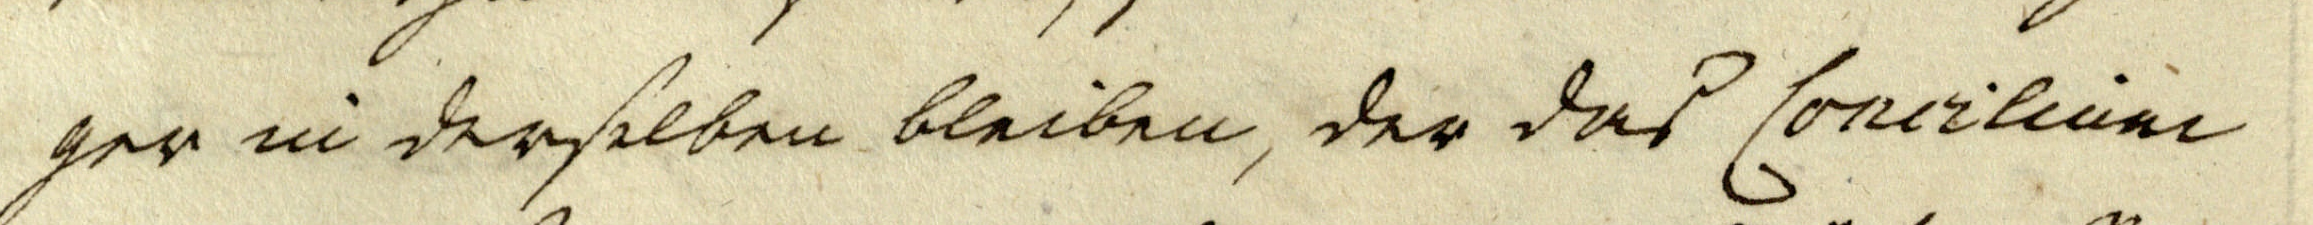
ger in derselben bleiben, der das Concilium
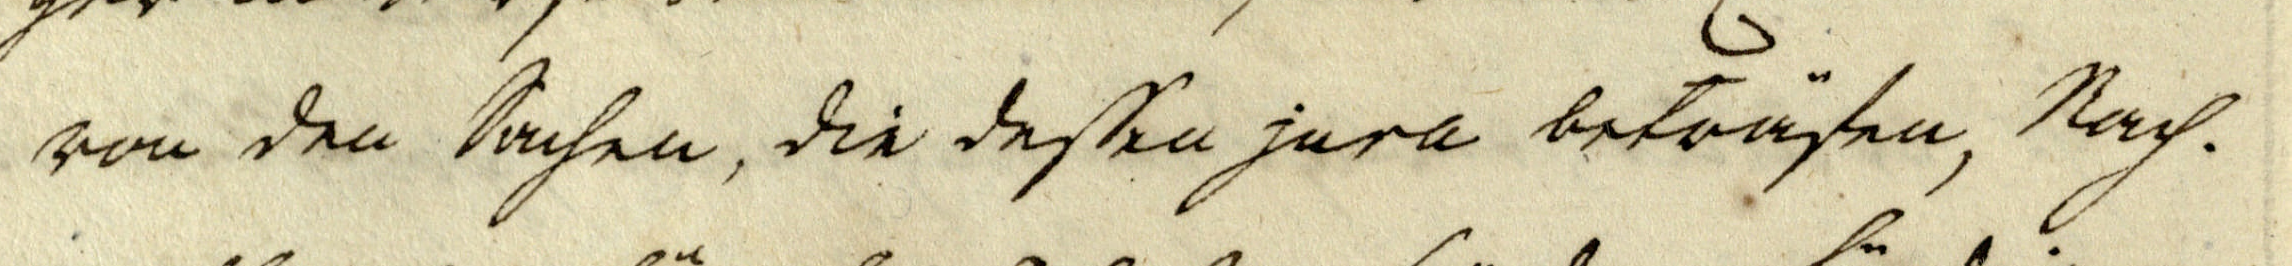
von den Sachen, die dessen jura beträfen, Nach¬
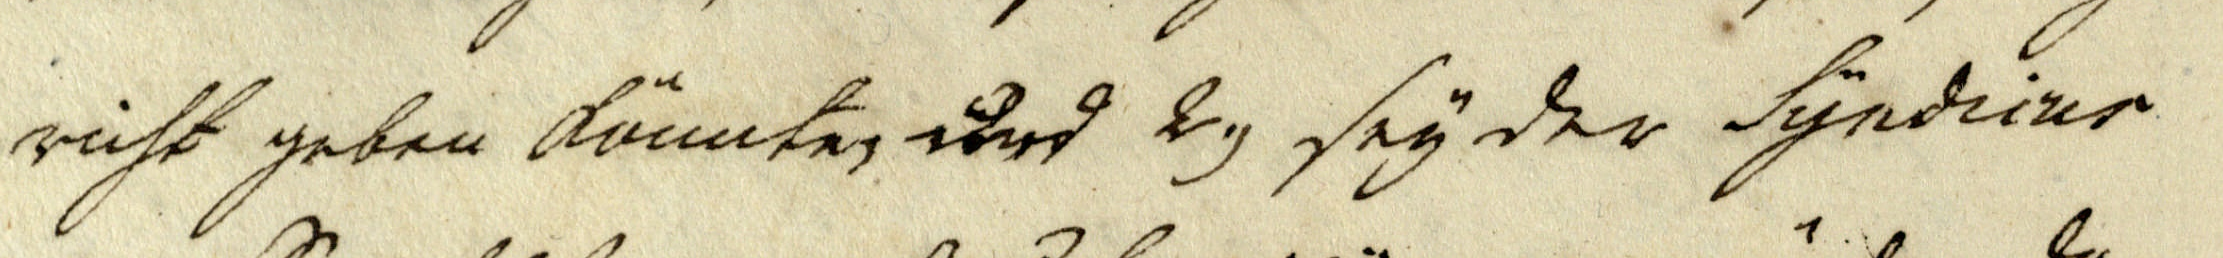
richt geben könnte, und 2., seÿ der Sÿndicus
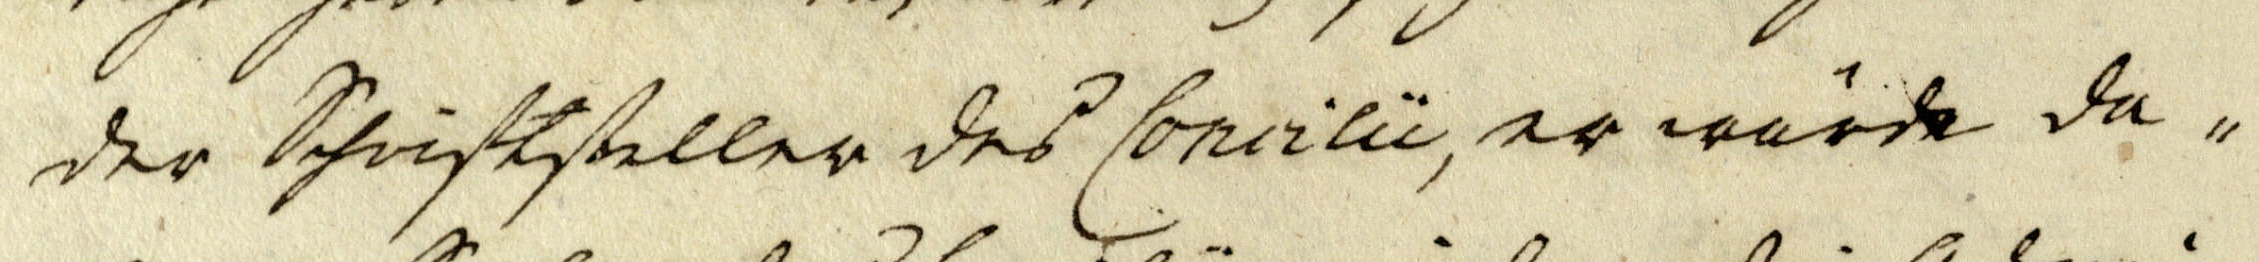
der Schriftsteller des Concilii, er würde da¬
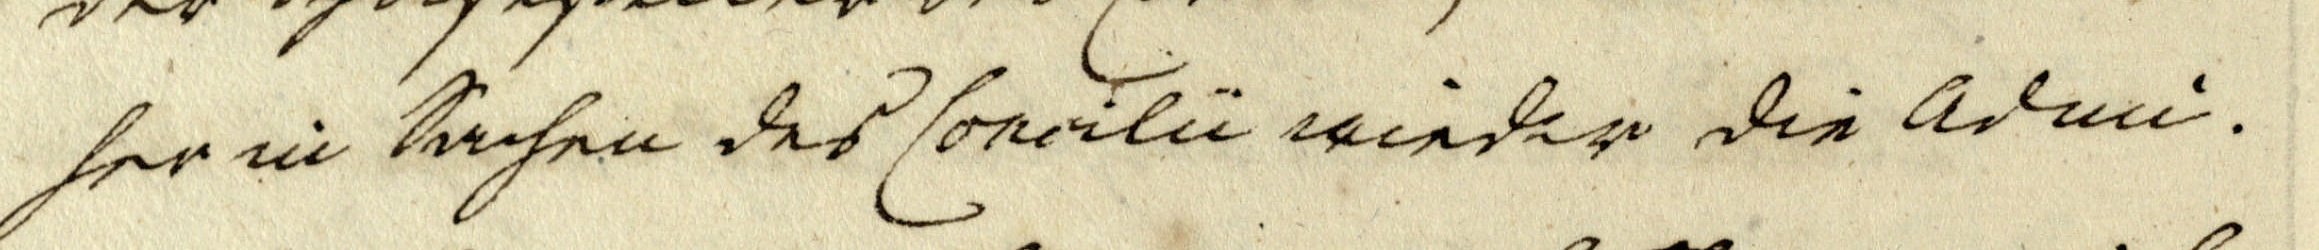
her in Sachen des Concilii wieder die Admi¬
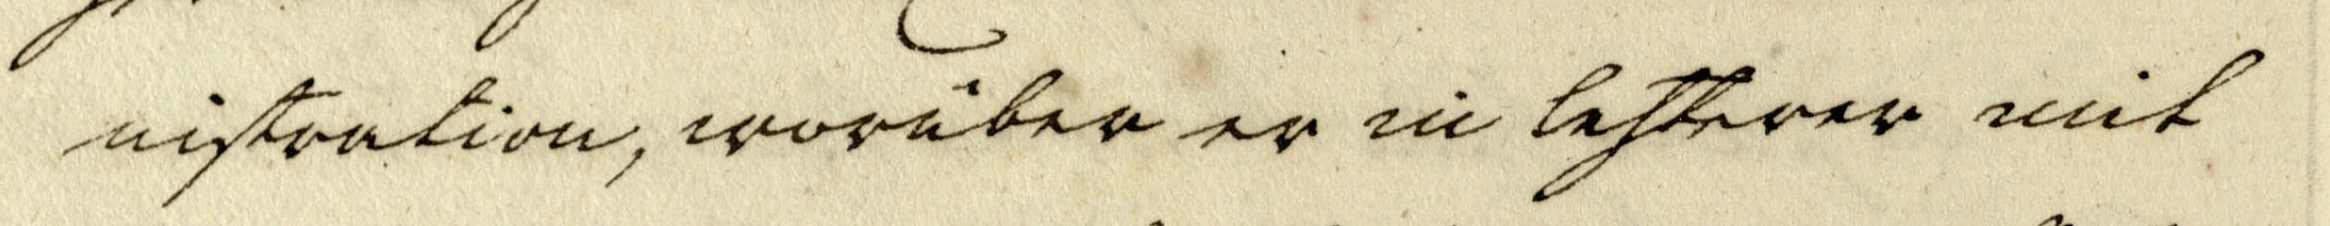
nistration, worüber er in letzterer mit
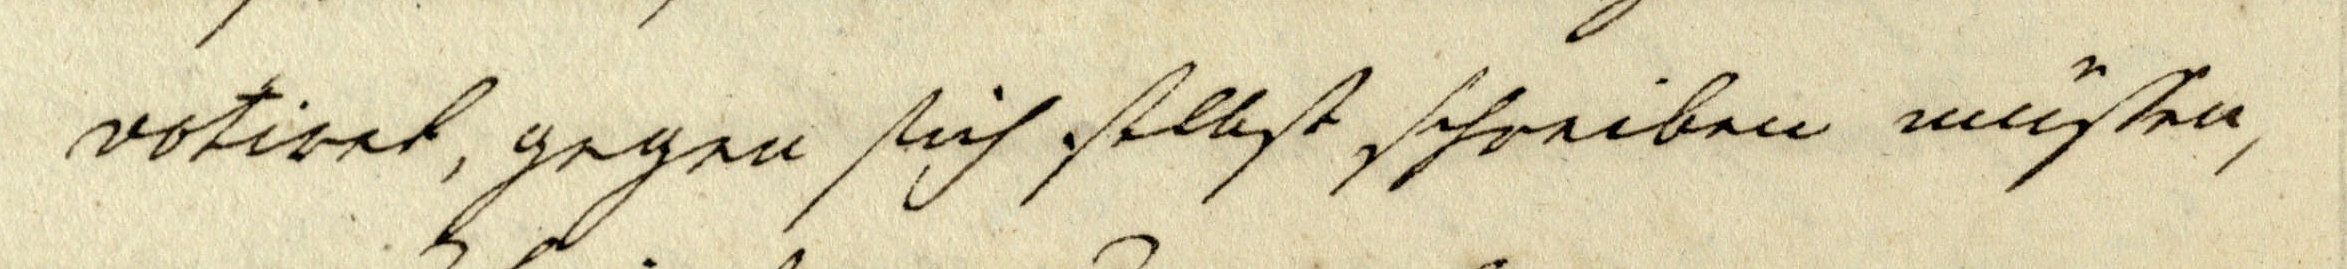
votiret, gegen sich selbst schreiben müssen,
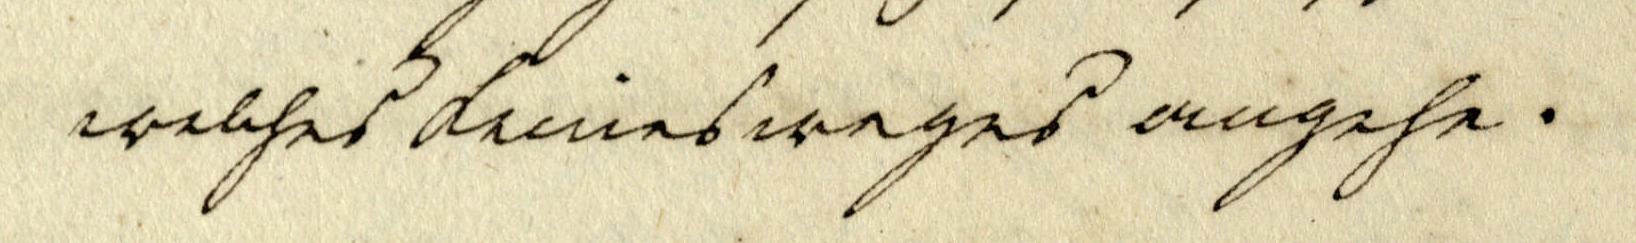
welches keinesweges angehe.
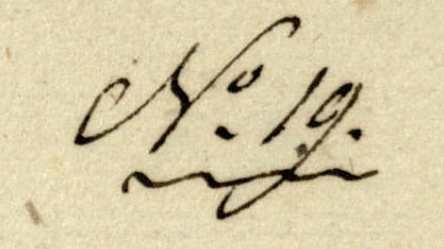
No 19.
